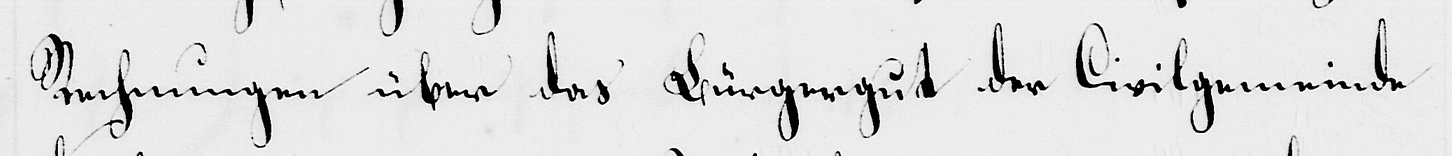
Rechnungen über das Bürgergut der Civilgemeinde
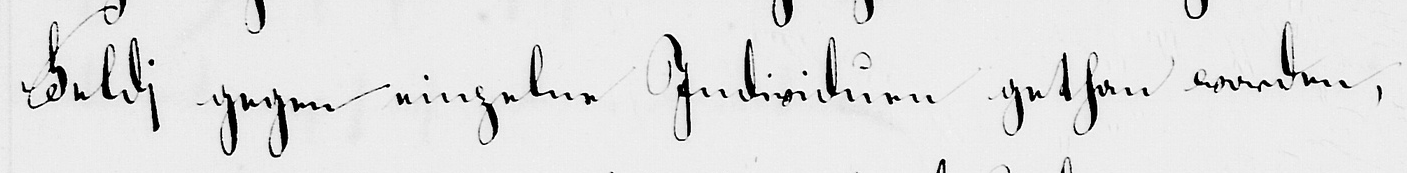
Feldi gegen einzelne Individuen gethan werden,
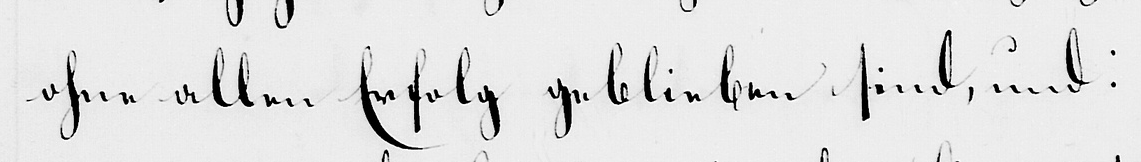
ohne allen Erfolg geblieben sind, und:
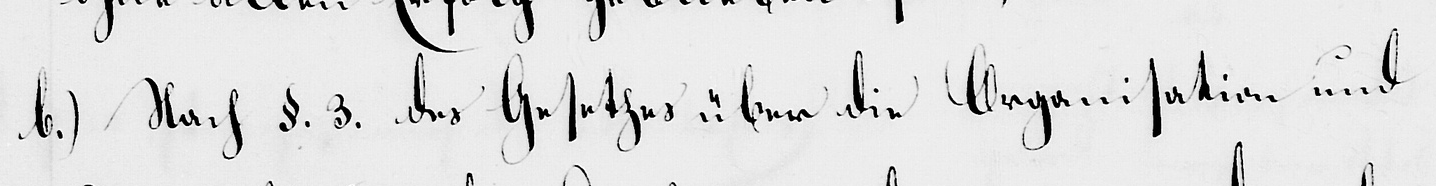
b.) Nach §. 3. des Gesetzes über die Organisation und
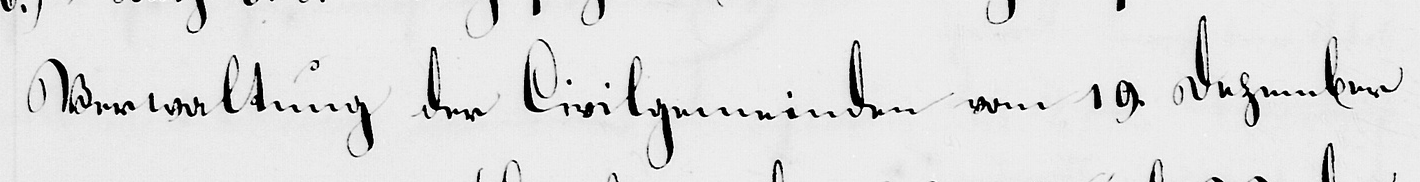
Verwaltung der Civilgemeinden vom 19. Dezember
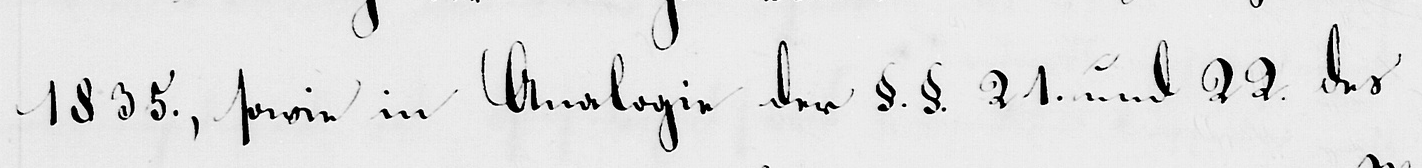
1835., sowie in Analogie der §. §. 21. und 22. des
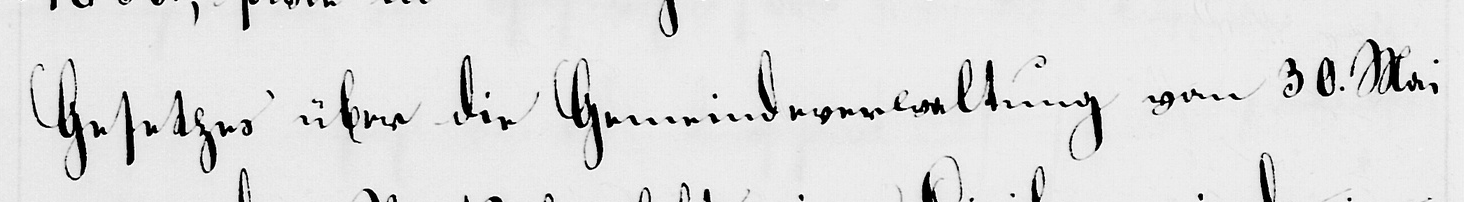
Gesetzes über die Gemeindeverwaltung vom 30. Mai
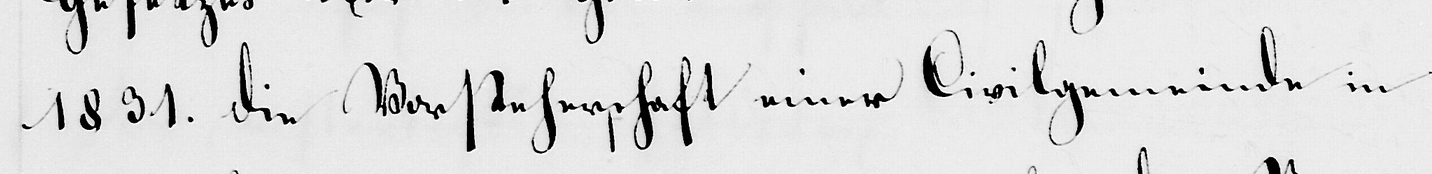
1831. die Vorsteherschaft einer Civilgemeinde in
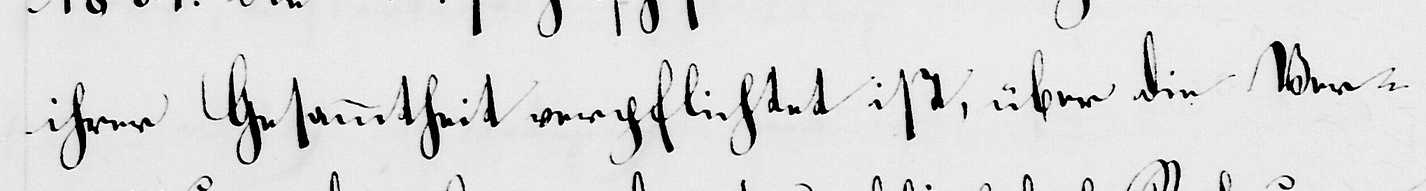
ihrer Gesammtheit verpflichtet ist, über die Ver¬
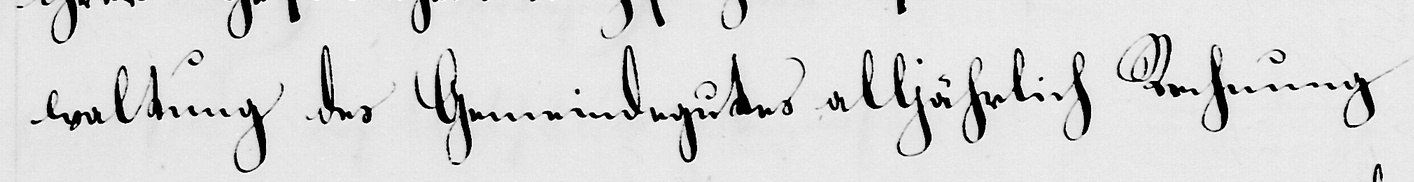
waltung des Gemeindegutes alljährlich Rechnung
